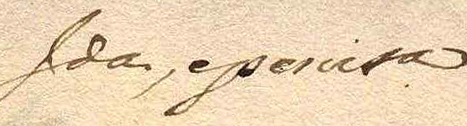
Ida, e penita
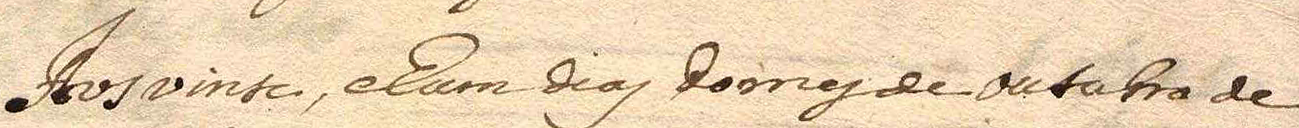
Aos vinte, e hum dias do mes de outubro de
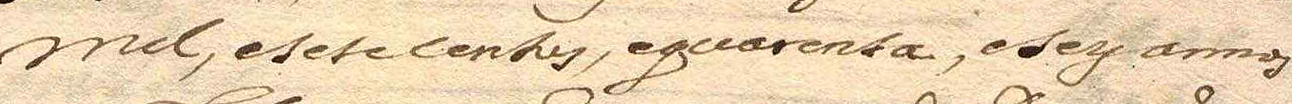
mil, e setecentos, e quarenta, e seis annos
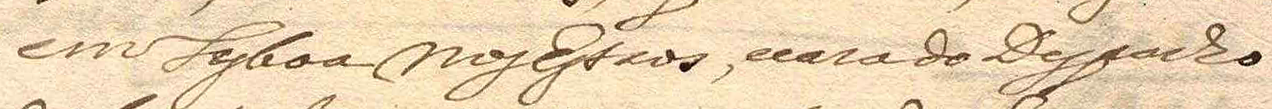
em Lisboa nos Estaos, e caza do Despacho
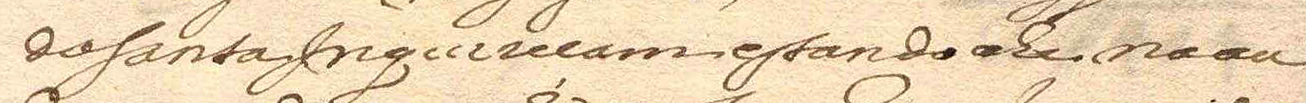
da santa Jnquiziçam estando ahi na au
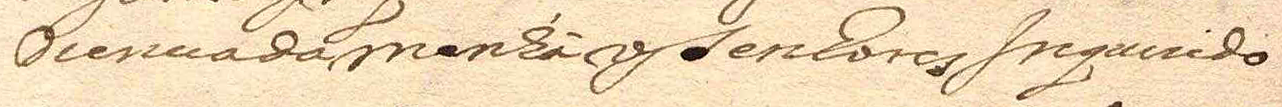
diencia da menhã os senhores Jnquizido
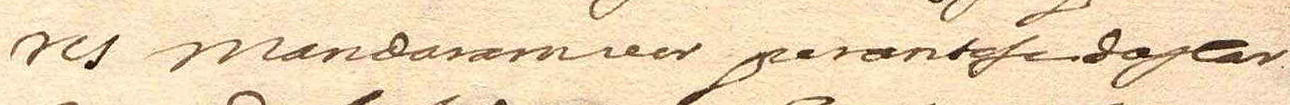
res mandaram vir perante si dos car
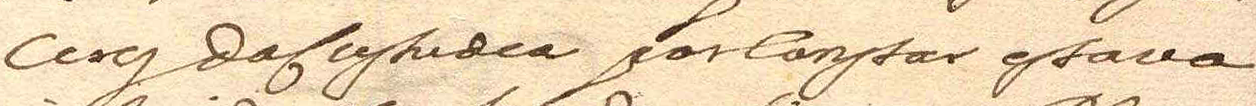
ceres da Custodia por constar estava
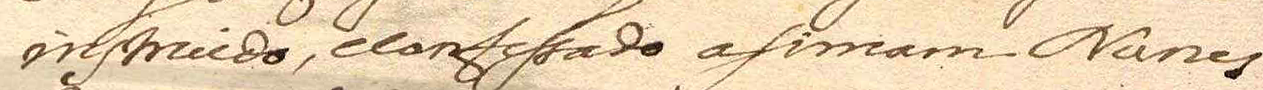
instruido, e confessado a simam Nunes
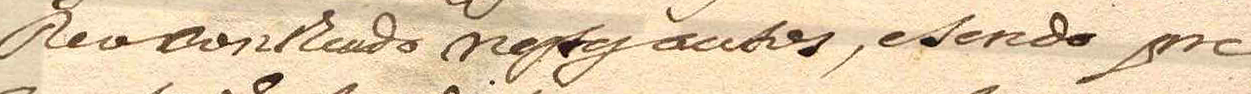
Reo contheudo nestes autos, e sendo pre
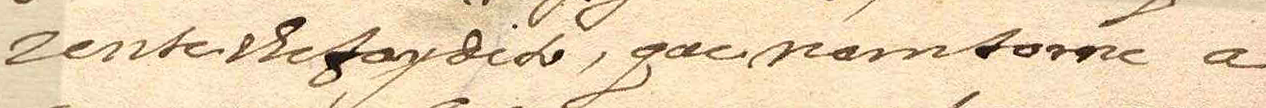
zente lhe foy dito, que nam torne a
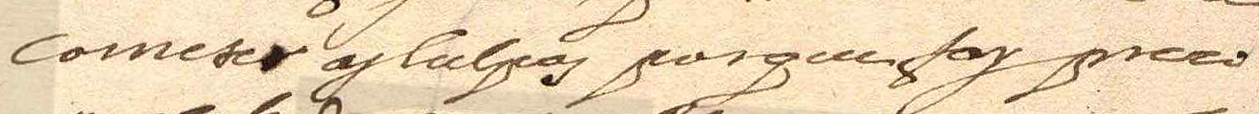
cometer as Culpas porque foy prezo
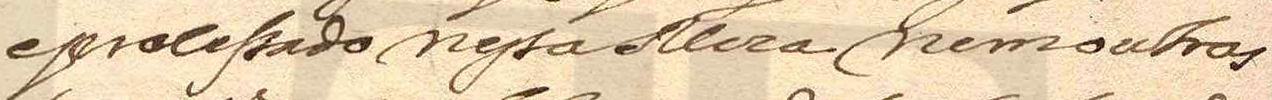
e processado nesta Meza nem outras
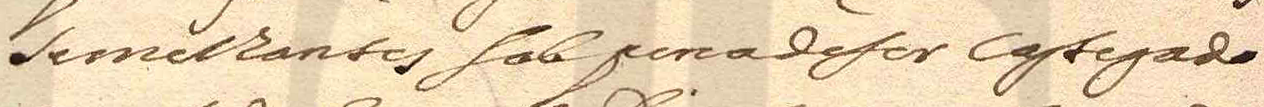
semelhantes sob pena de ser castigado
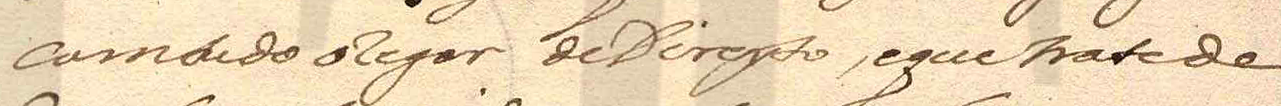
com tudo o Rigor de Direyto, e que trate de
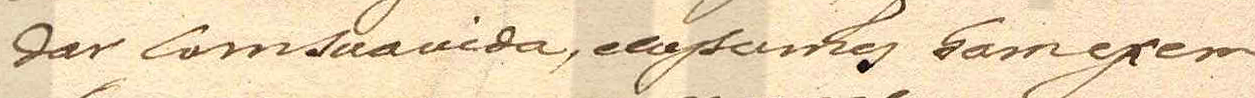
dar com sua vida, e custumes bom exem
